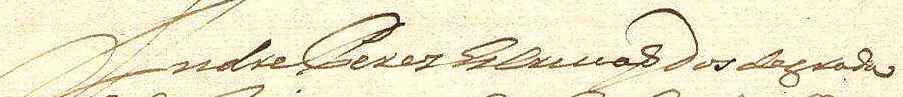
Andre Peres Escriuaõ dos degrada
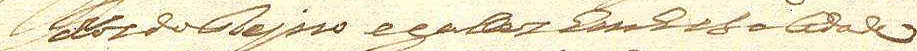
dos do Rejno e galeez Em Esta Cidade
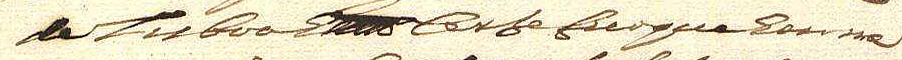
de Lisboa Ett Certefico que Em no
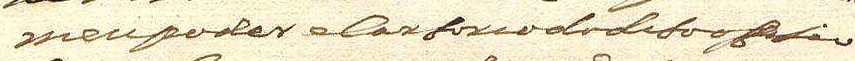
meu poder e Cartorio do dito officio
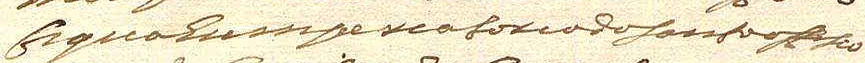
fiqua hum percatorio do santo offisio
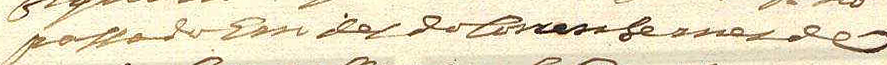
passado Em des do Corrente mes de
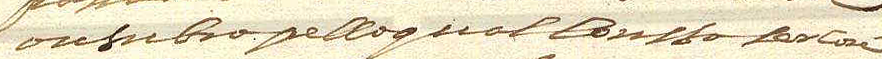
outubro pello qual Consta ser con
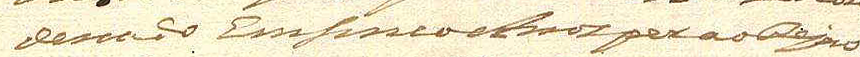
denado Em sinco Anos pera o Rejno
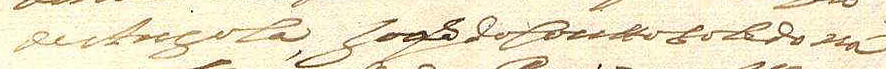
de Angola, Joaõ do Coutto toledo na
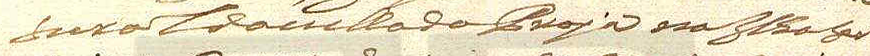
tural da uilla da Praja na Jlha ter
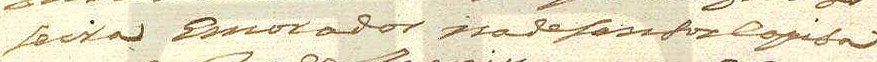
seira E morador na de santos capita
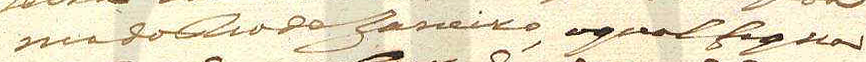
ma do Rio de Janeiro, o qual fiqua
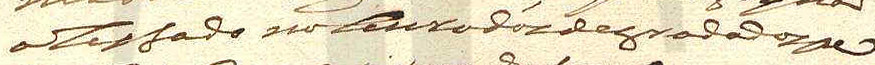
alestado no liuro dos degradados pe
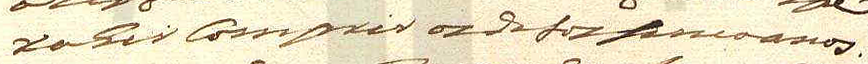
ra hir comprir os ditos sinco anos.
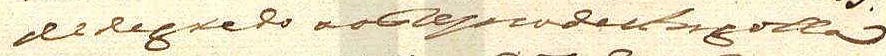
de degredo ao Rejno de Angolla
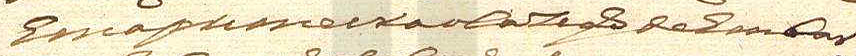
Em a primeira ocaziaõ de Embar
